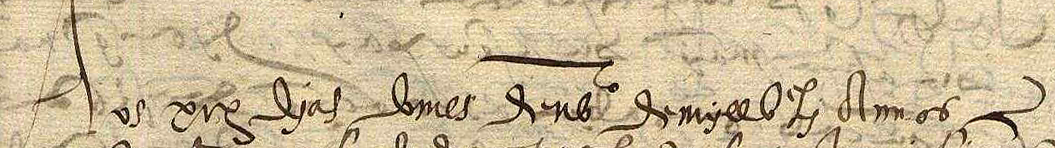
Aos xix dyas do mes de nbro de myll bc Lj Annos ē
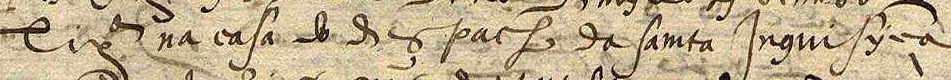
lixa na casa do despacho da samta Jnquisyçā
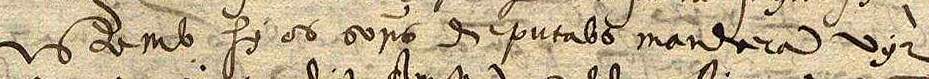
estando hy os sor̄es deputados mandarā vyr
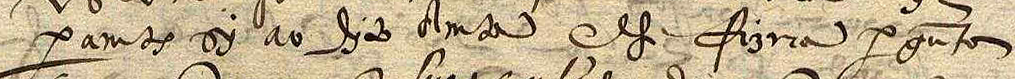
ꝑamte sy ao dyto Amtā e lhe fizerā ꝑgu̅ta
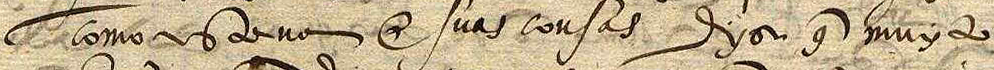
como estaua ē suas cousas dyse q̄ muyto
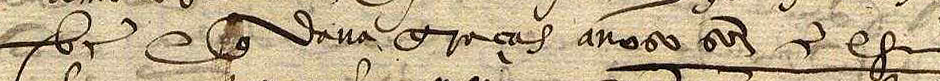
bē e q̄ daua graças a noso sōr ē lhe
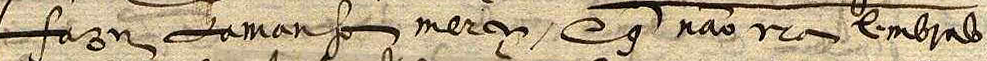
fazer tamanha merce / e q̄ não era lembrado
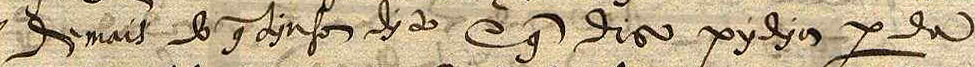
de mais do q̄ tynha dyto e q̄ diso pydya ꝑdā
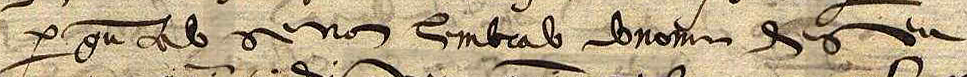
ꝑgūtado se era lembrado do nome de seu
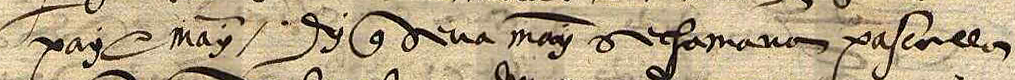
pay e mãy / dy q̄ seua mãy se chamaua pascoella
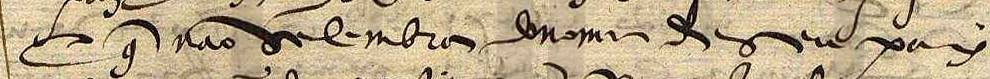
e q̄ não se lembra do nome de seu pay
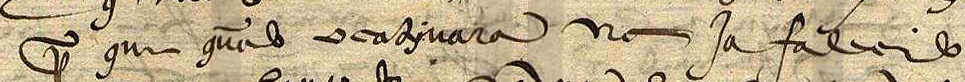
p̄oque qūado o catyuarā era Ja falecido
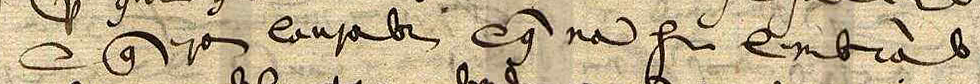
e q̄ era laurador e q̄ nā he lembrado
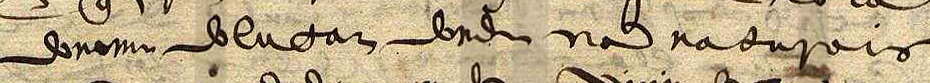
do nome do lugar donde erā naturais
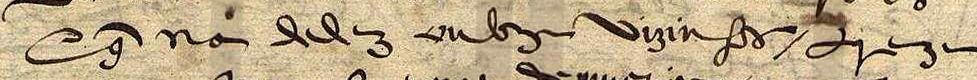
e q̄ era de dez ou doze vizinhos / treze
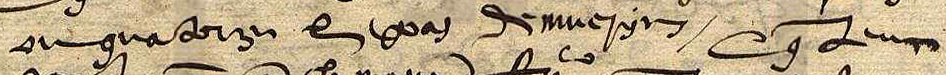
ou quatorze legoas de mucryns / e q̄ teue
